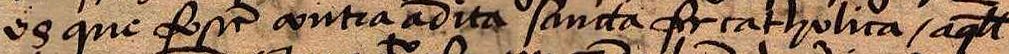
os que fossē contra a dita sancta fee catholica / a q̄ll
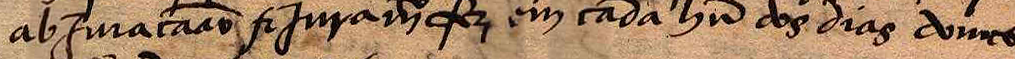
abJuraçaão e Juramto fez em cada hū dos dias do mes
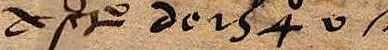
de seto de 1540
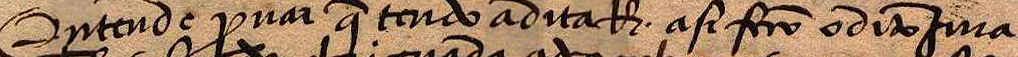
Entende ꝓuar q̄ tendo a dita R. asi fcc̄o o dito Jura
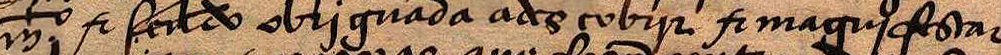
mto e sendo obriguada a descobrjr e magnjfestar
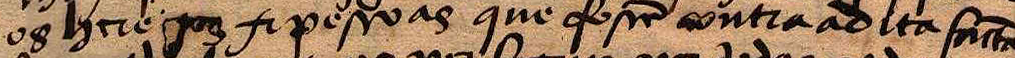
os hereges e pessoas que fossē contra a dita sācta
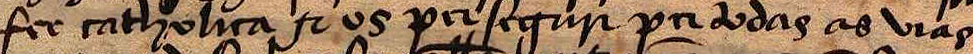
fee catholica e os persegujr per todas as vias
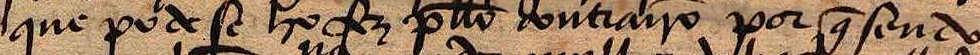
que podese ho fez p̄llo contrairo porq̄ sendo
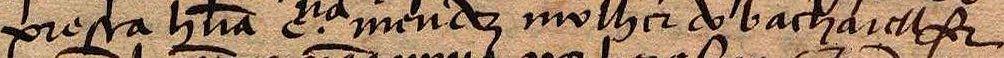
pressa hūa c.na mendez molher do bacharell fer
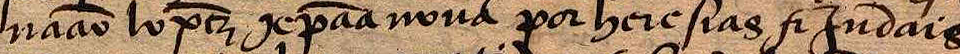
naão lopez xpaā noua por heresias e Judais
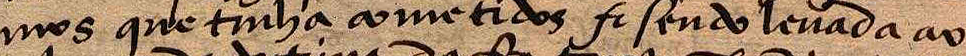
mos que tinha cometidos e sendo leuada ao
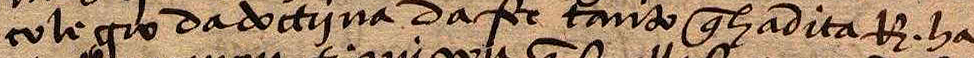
colegio da doctrjna da fee tanto q̄ ha dita R. ha
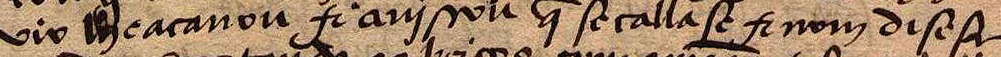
vio lhe açanou e aujssou q̄ se callase e nom disese
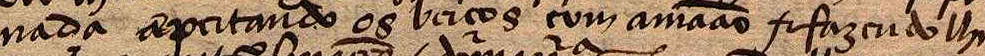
nada apertando os beiços com a maão e fazendo lhe
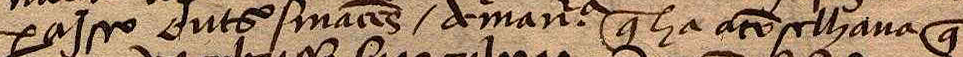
ꝑa Jsso outos sinaees / de man.ra q̄ ha ac̄oselhaua q̄
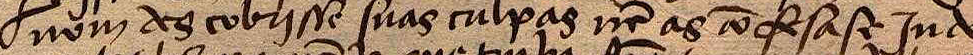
nom descobrjsse suas culpas nē as c̄ofesase Jndo
